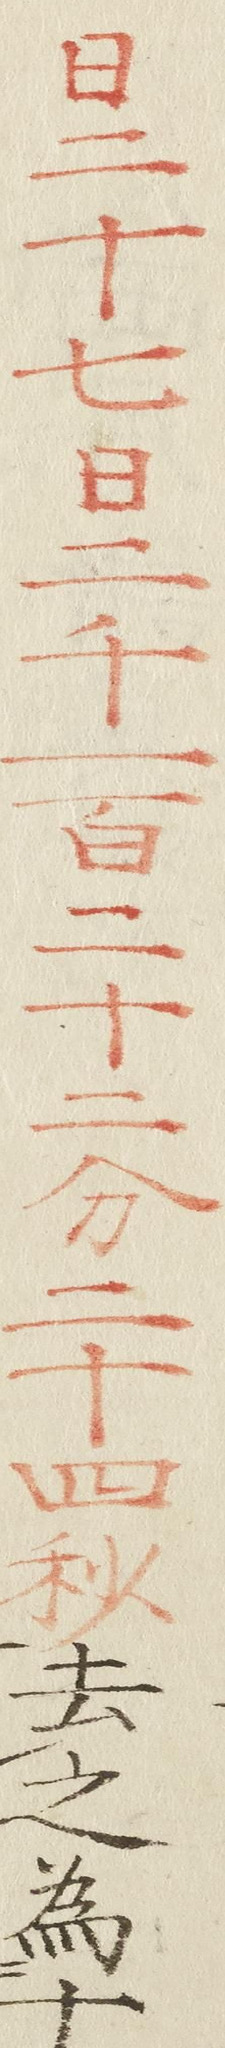日二十七日二千一百二十二分二十四秒去之為十
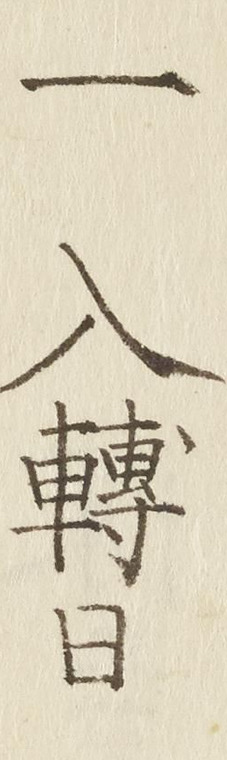一入転日
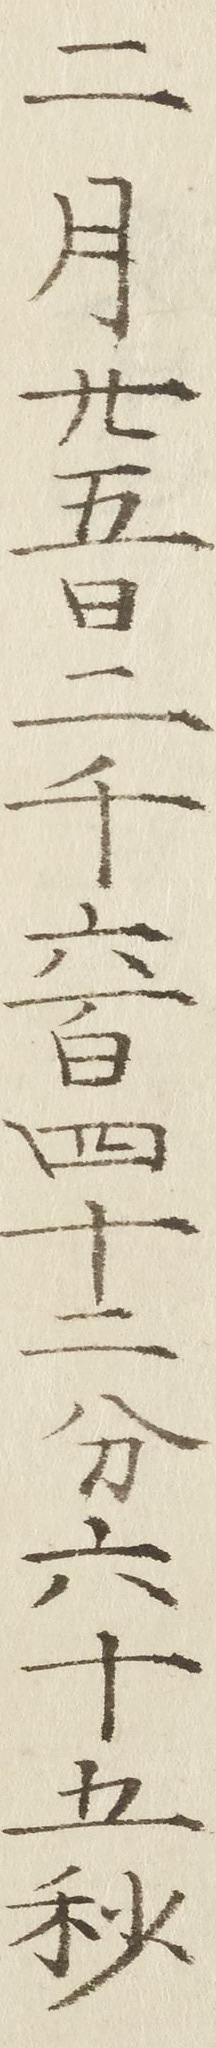二月廿五日二千六百四十二分六十五秒
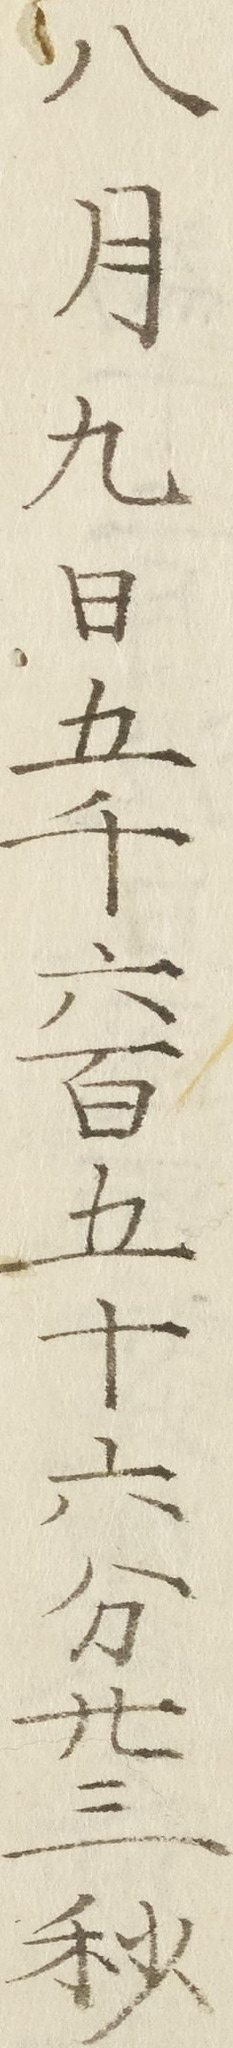八月九日五千六百五十六分廿三秒
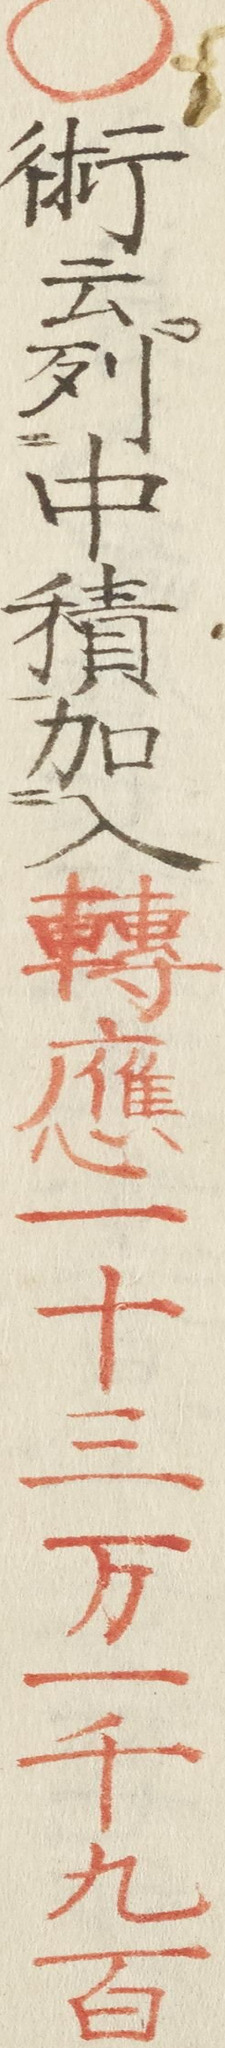○術云。列中積加入転応一十三万一千九百
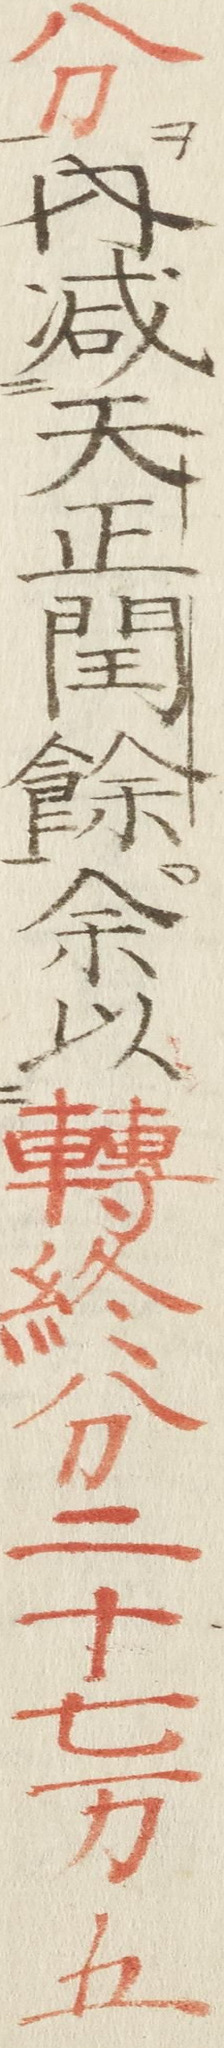分内減天正閏餘。余以転終分二十七万五
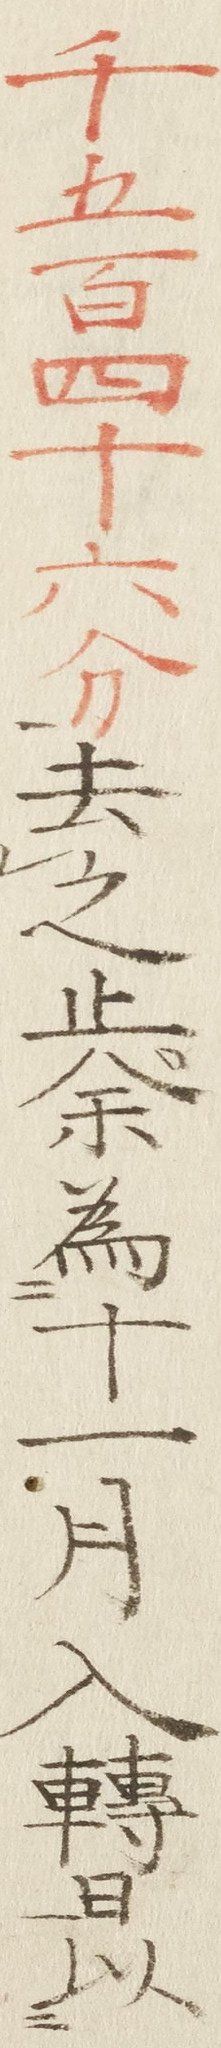千五百四十六分去之止。余為十一月入転日以
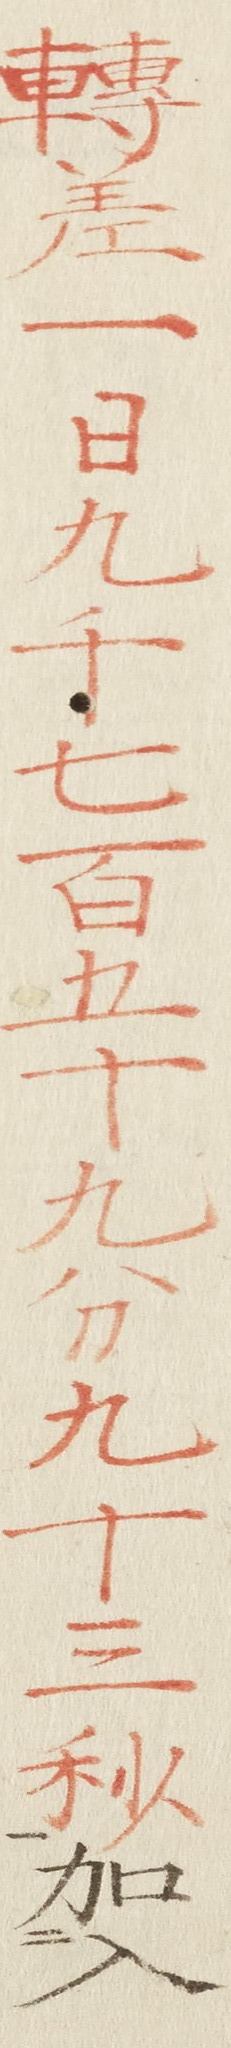転差一日九千七百五十九分九十三秒加入
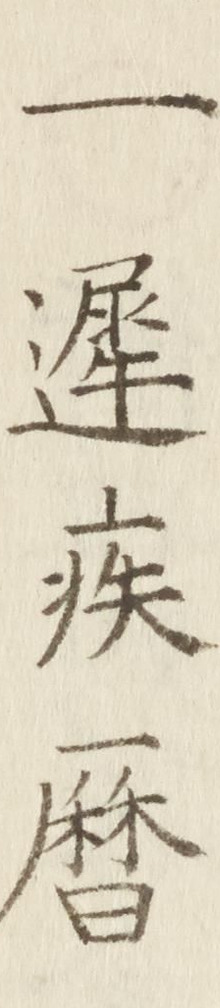一遅疾暦
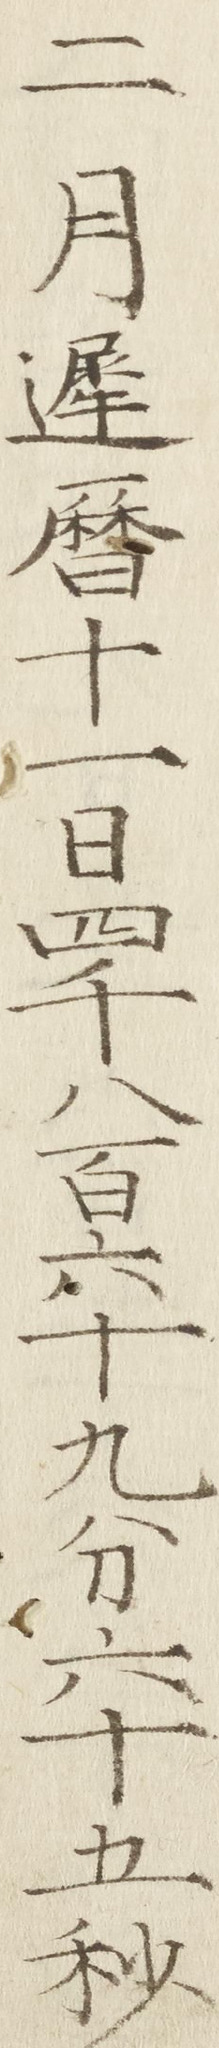二月遅暦十一日四千八百六十九分六十五秒

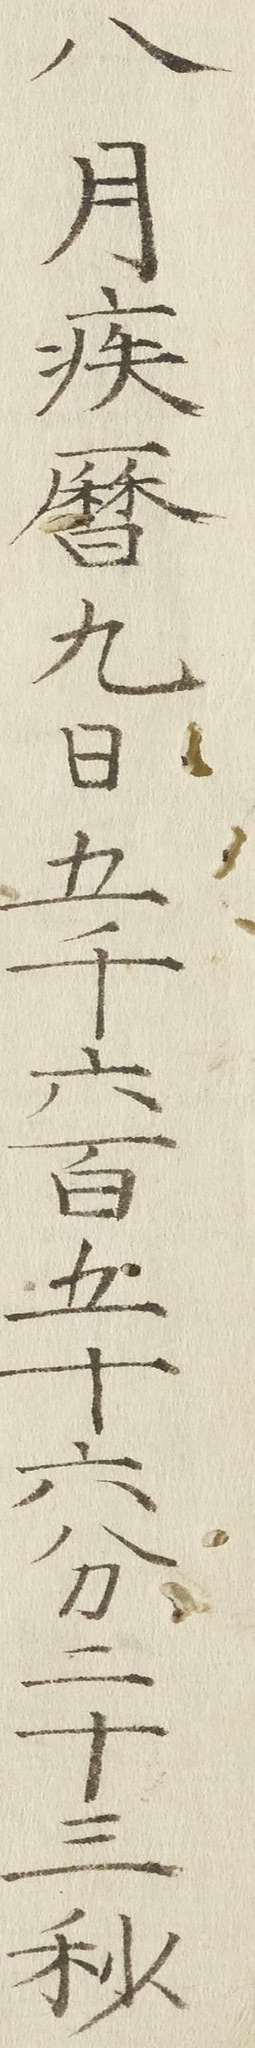八月疾暦九日五千六百五十六分二十三秒
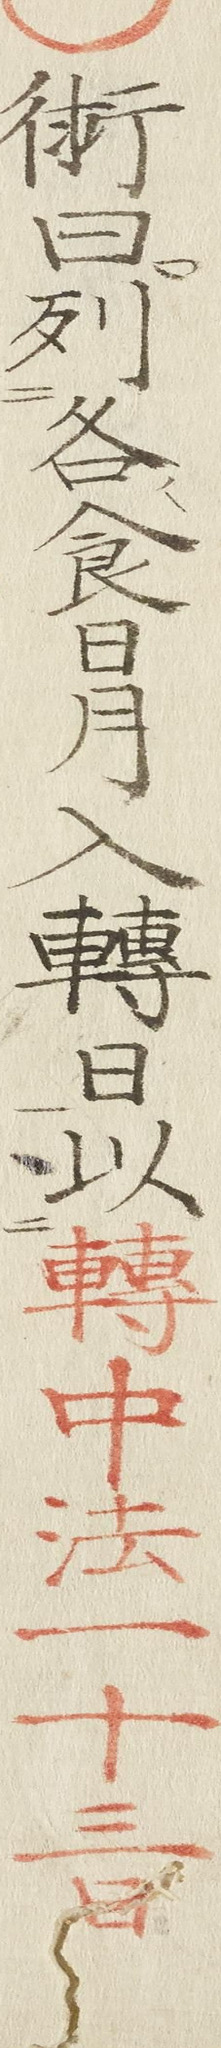○術曰。列各〱食日月入転日以転中法一十三日
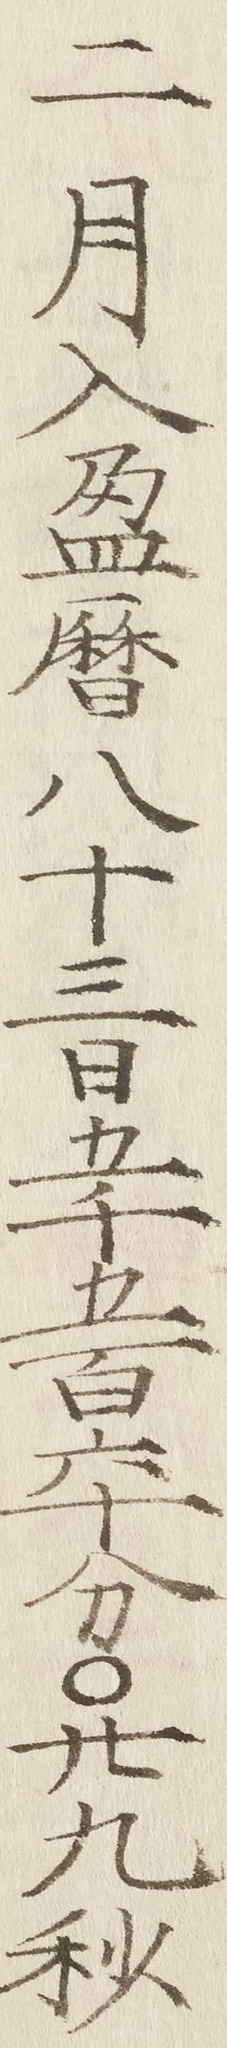二月入盈暦八十三日五千五百六十分〇廿九秒
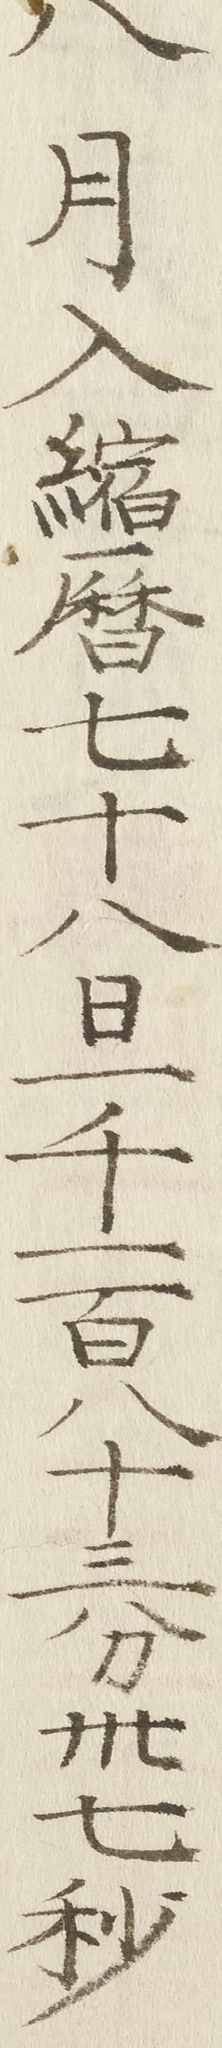八月入縮暦七十八日一千一百八十三分卅七秒
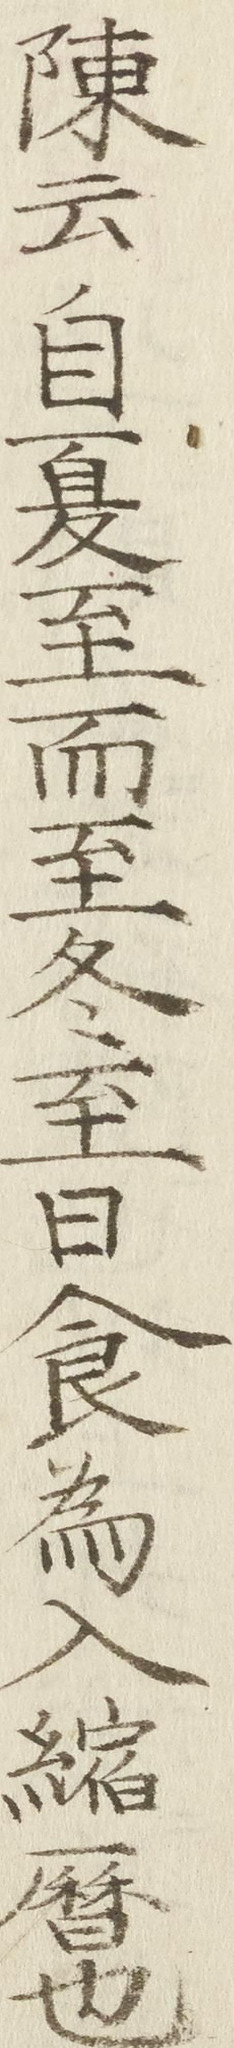陳云自夏至而至冬至食為入縮暦也
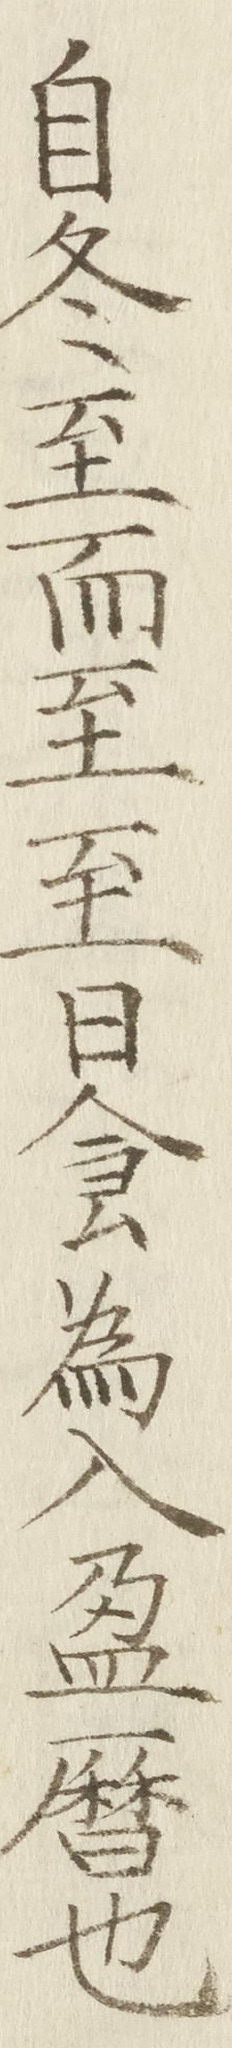自冬至而至至日食為入盈暦也
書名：日食度
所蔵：東京大学地震研究所図書室 Earthquake Research Institute Library, The University of Tokyo, JAPAN
